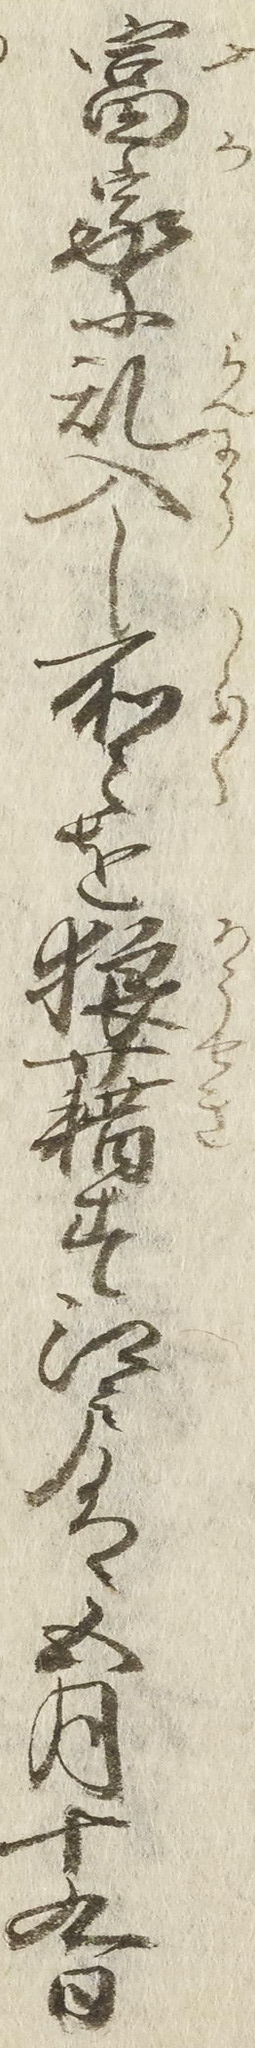富家に乱入し所〻を狼藉す江戸は五月十九日
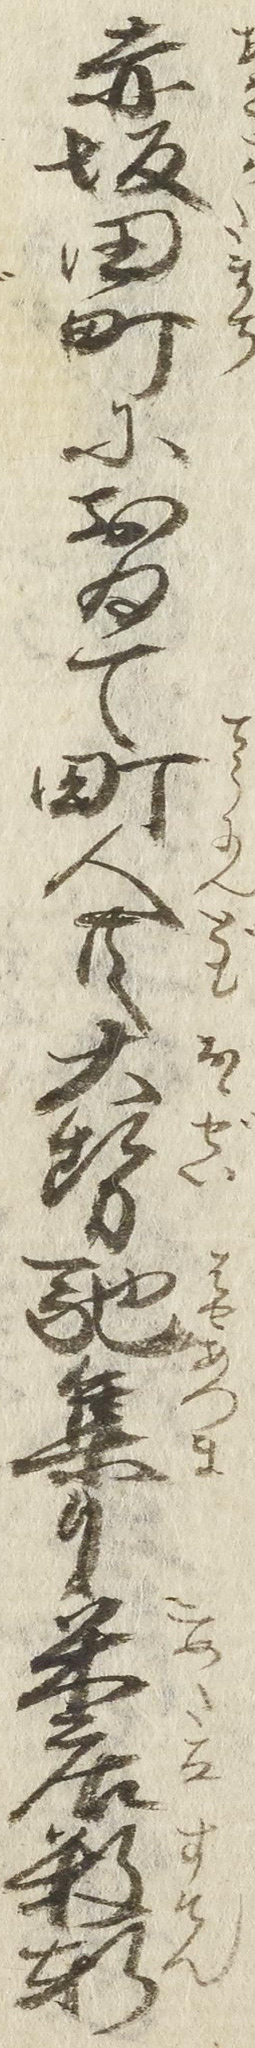赤坂田町におゐて町人共大勢馳集り米店数軒
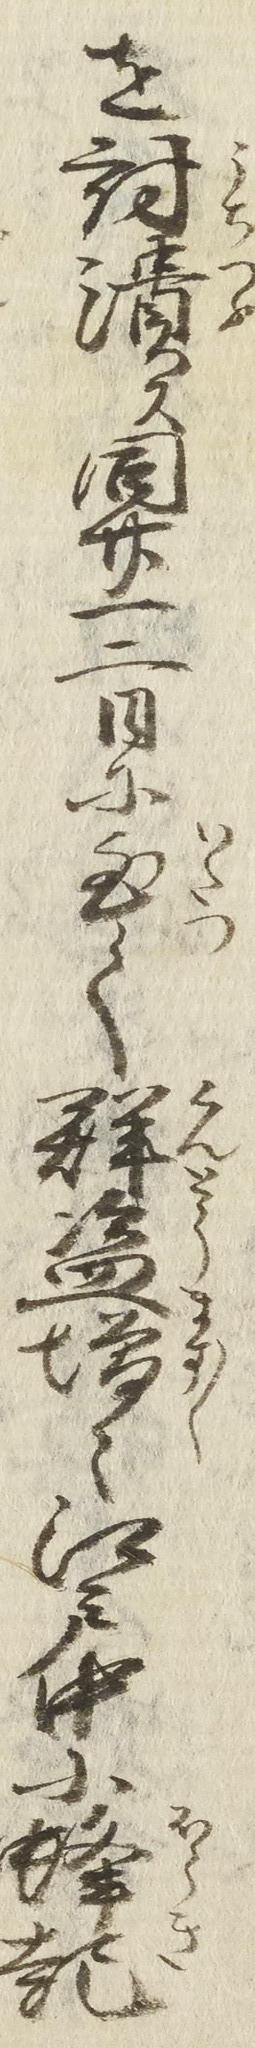を討潰ス同廿一二日に至て群盗増〻江戸中に蜂起
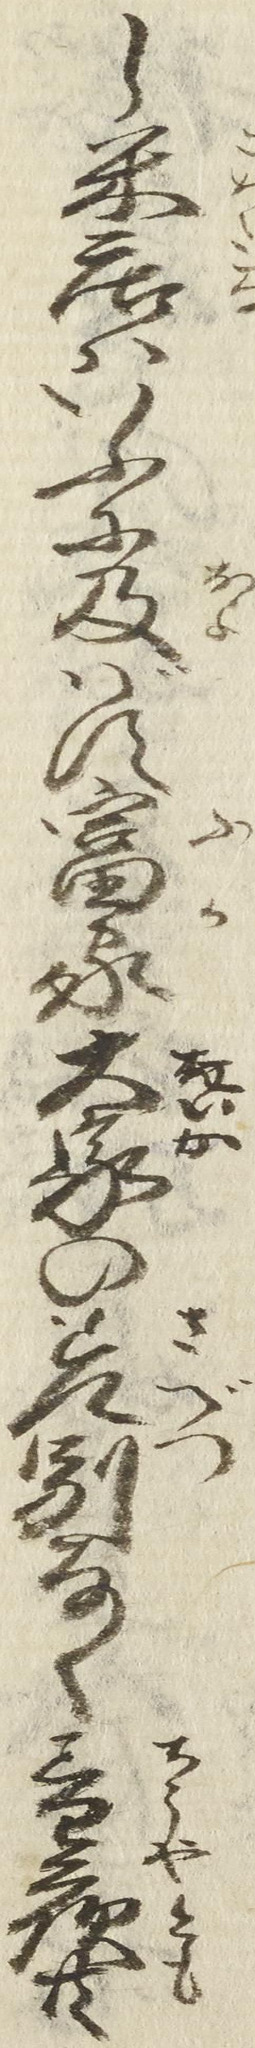し米店はいふに及ばず富家大家の差別なく昼夜共
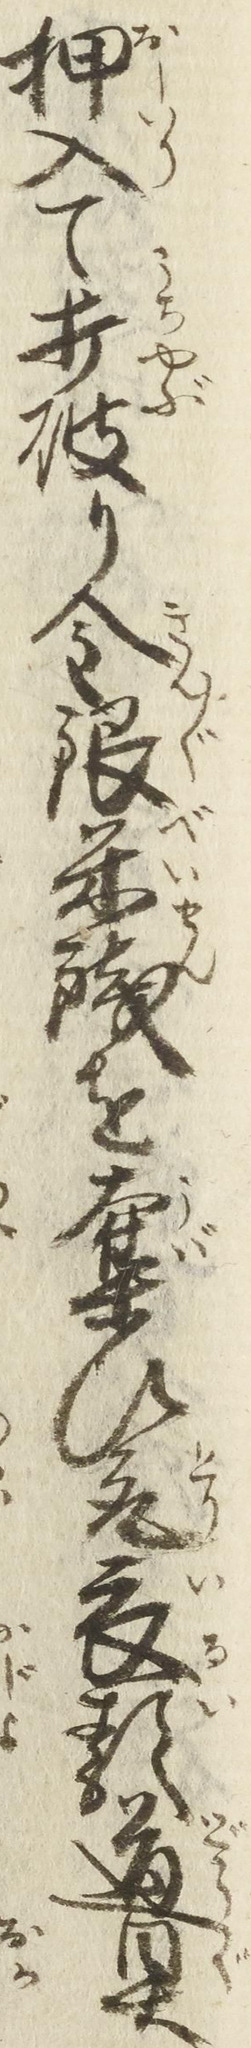押入て打破り金銀米銭を奪ひ取衣類道具
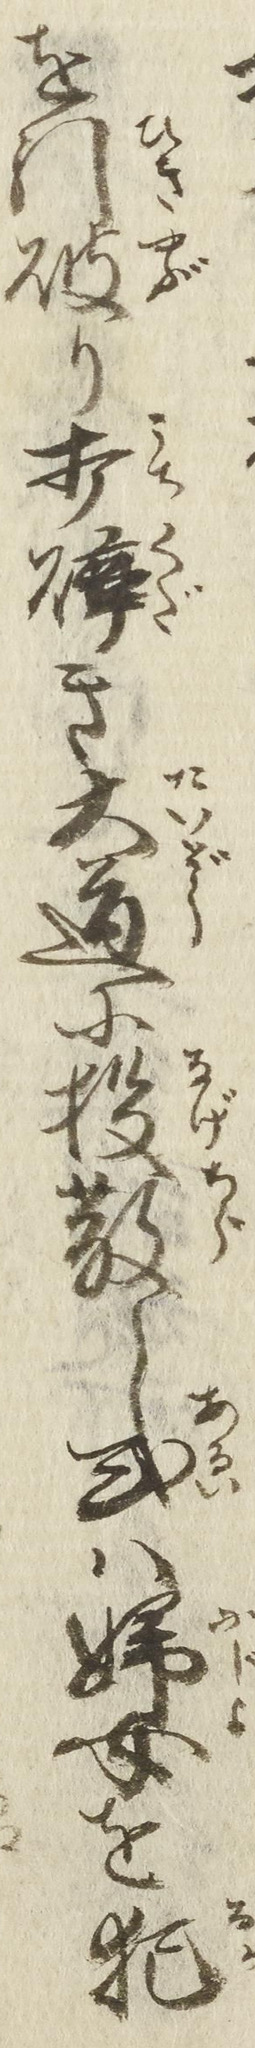を引破り打砕き大道に投散し或は婦女を犯
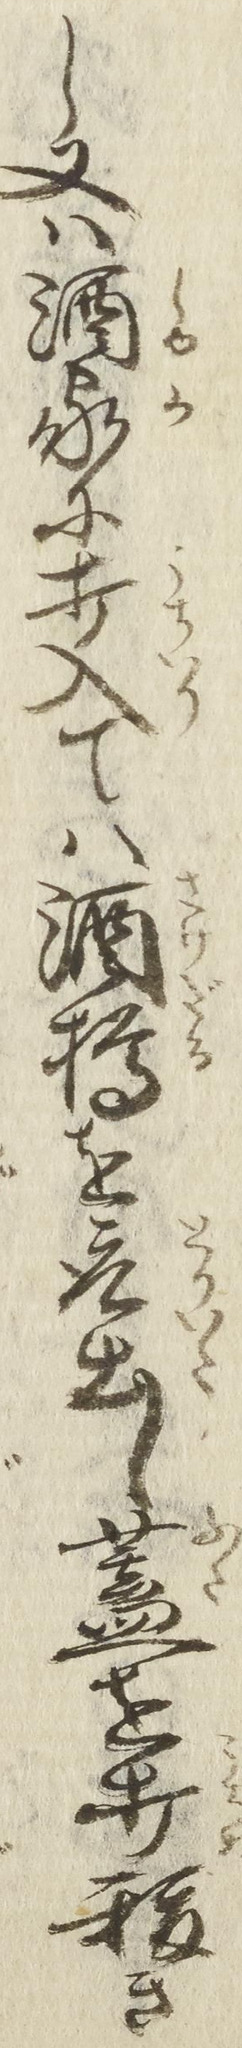し又は酒家に打入ては酒樽を取出し蓋を打抜き
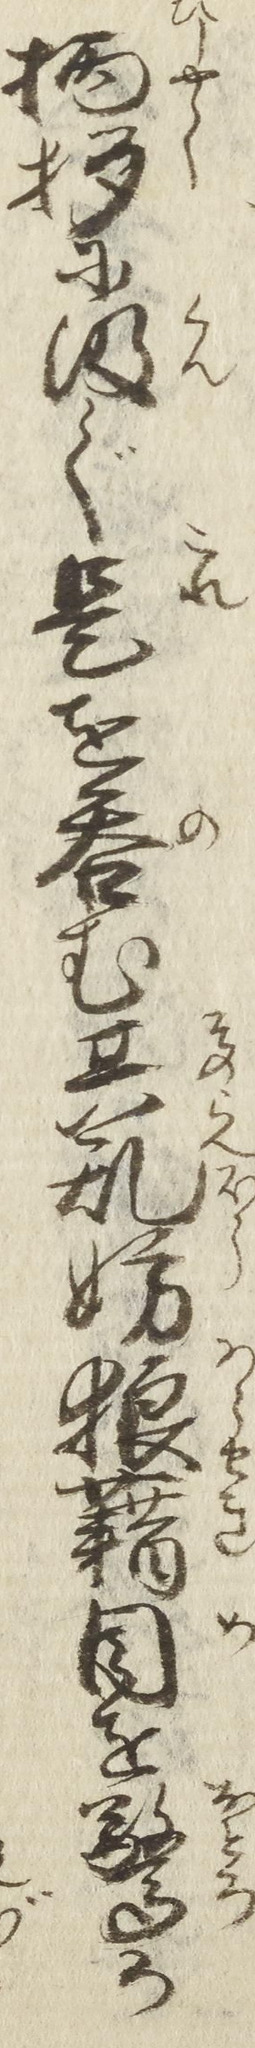柄杓に汲で是を呑む其乱妨狼藉目を驚か
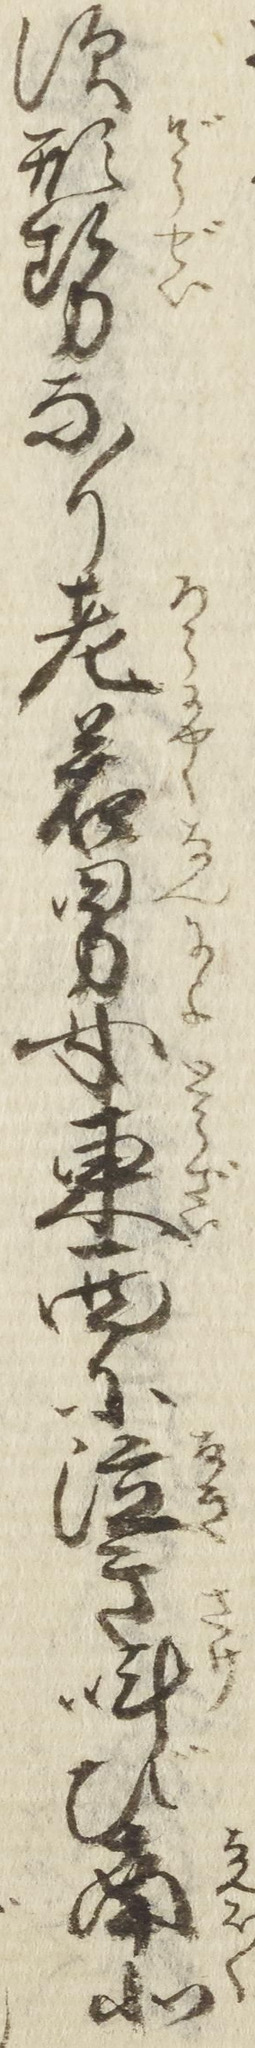す形勢なり老若男女東西に泣き叫び南北
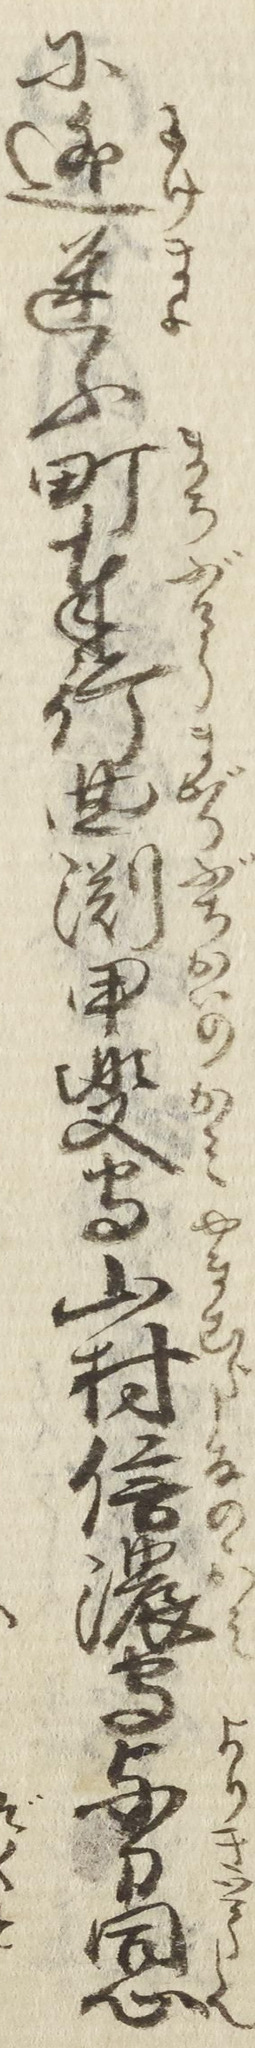に逃迷ふ町奉行曲渕甲斐守山村信濃守与力同心
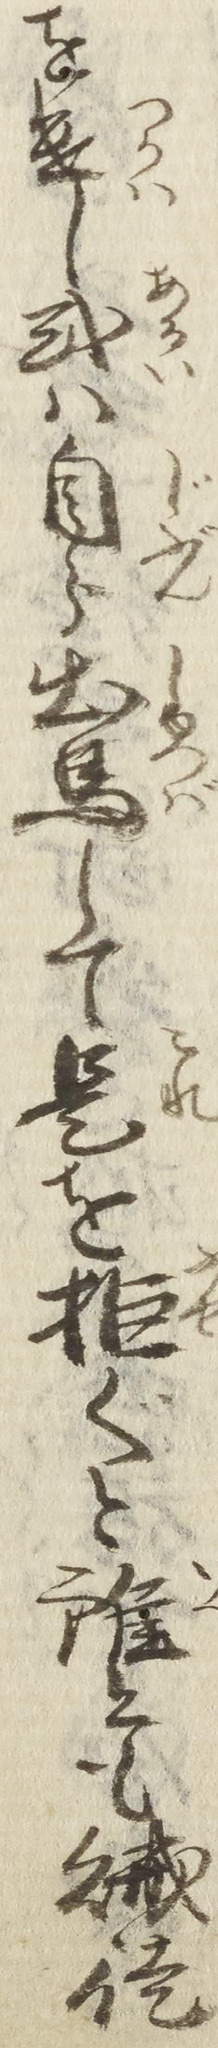を遣し或は自分出馬して是を拒ぐと雖とも賊徒
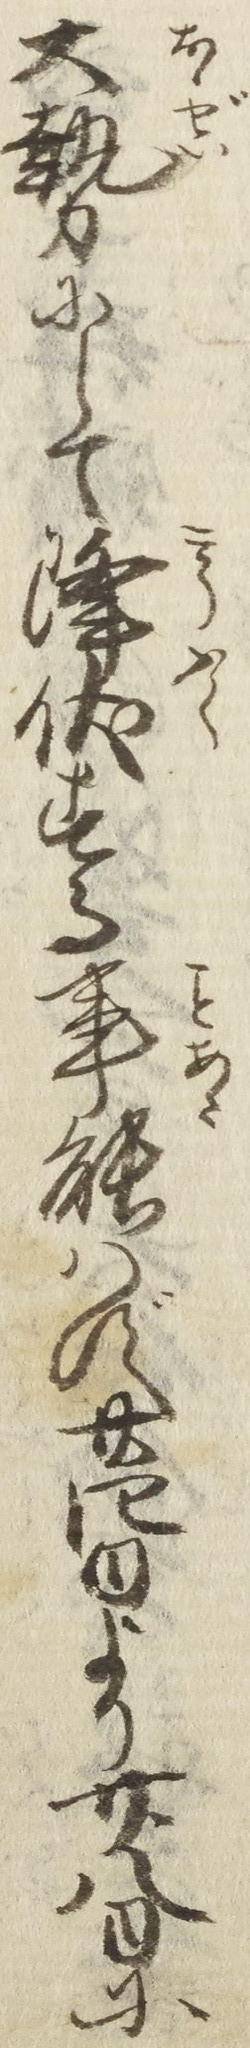大勢にして降伏する事能はず廿四日より廿八日に

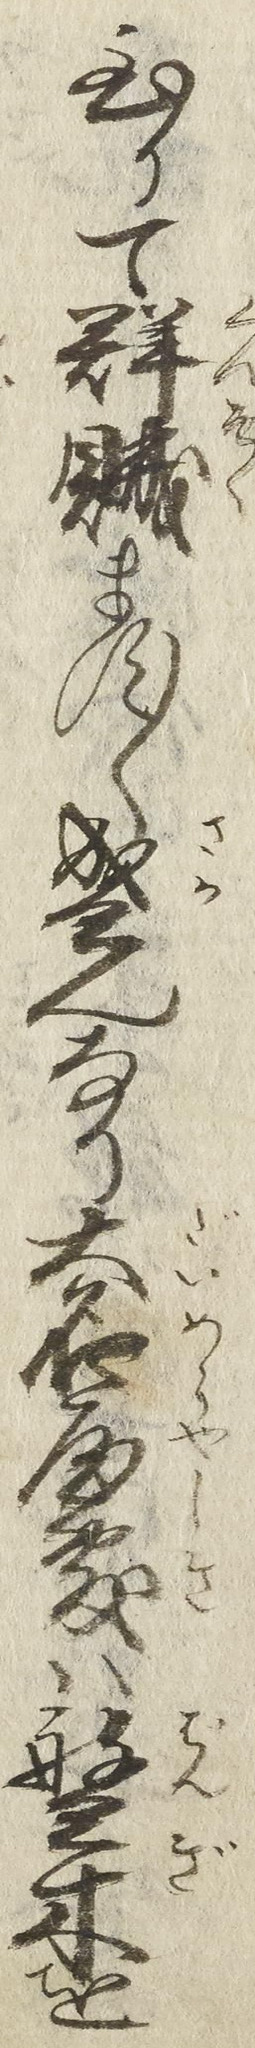至りて群賊ます〳〵盛んなり大名屋敷は盤木を
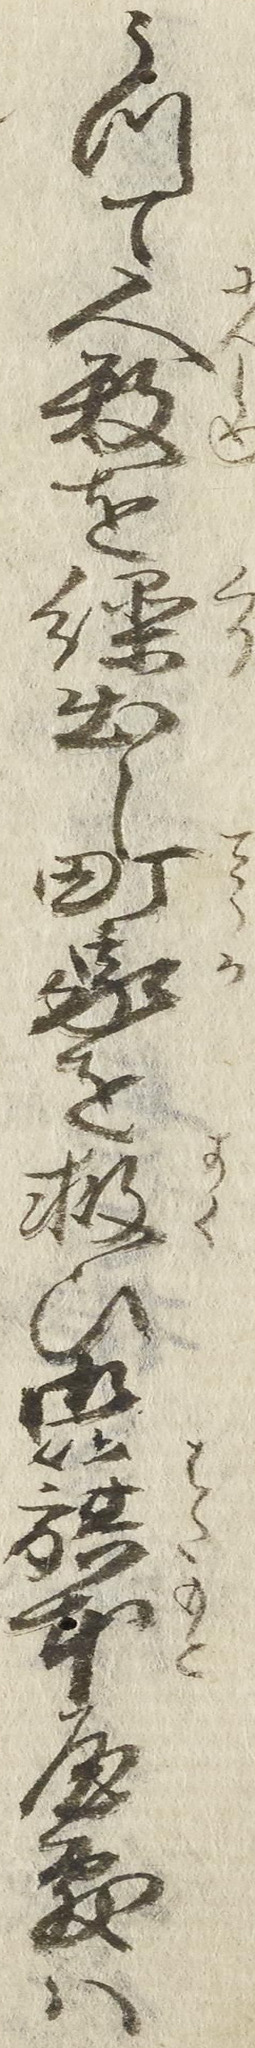もつて人数を繰出し町家を救ひ御旗本屋敷は
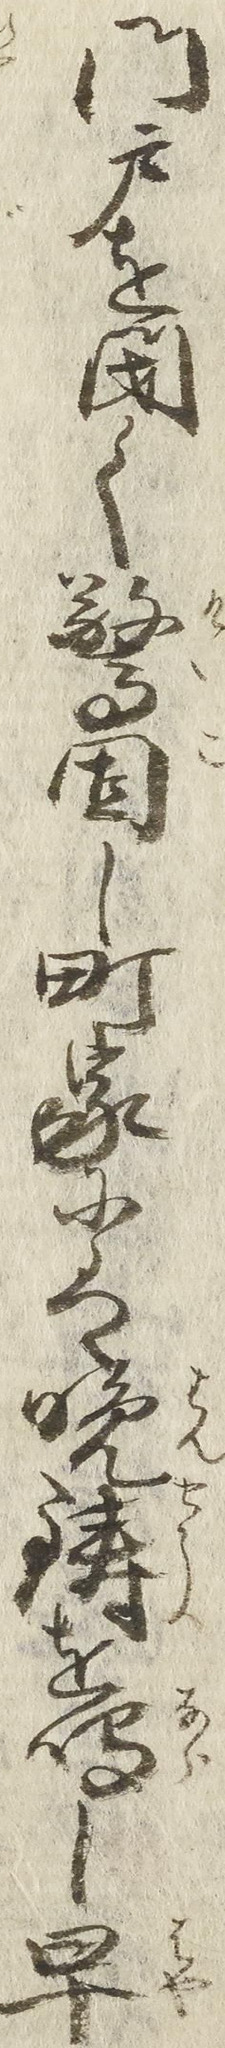門戸を閉て警固し町家には晩鋳を鳴し早
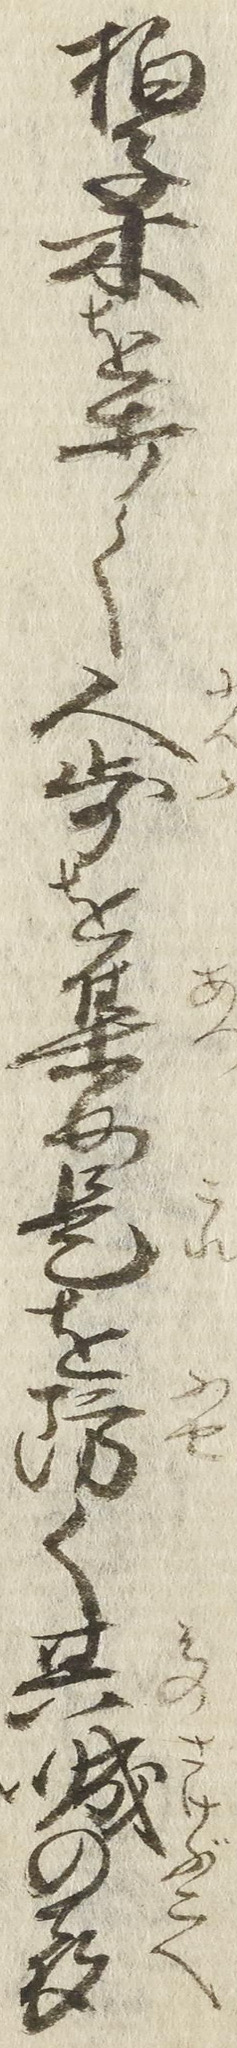拍子木を打て人歩を集め是を防く其喊の声
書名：天明奇畧　全
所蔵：東京大学地震研究所図書室 Earthquake Research Institute Library, The University of Tokyo, JAPAN
